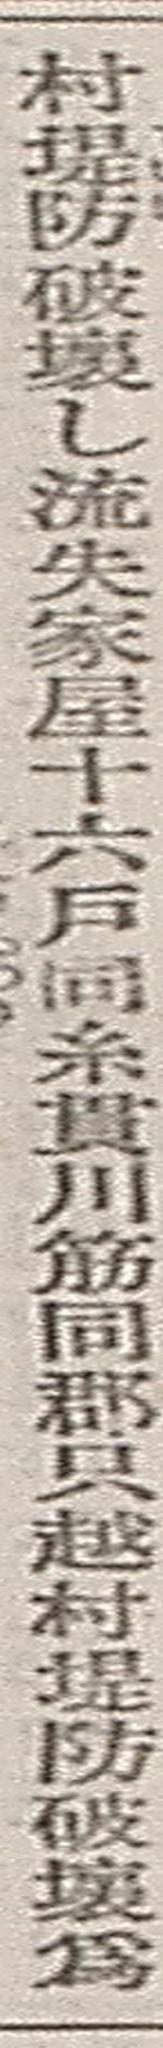村堤防破壊し流失家屋十六戸同糸貫川筋同郡只越村堤防破壊為
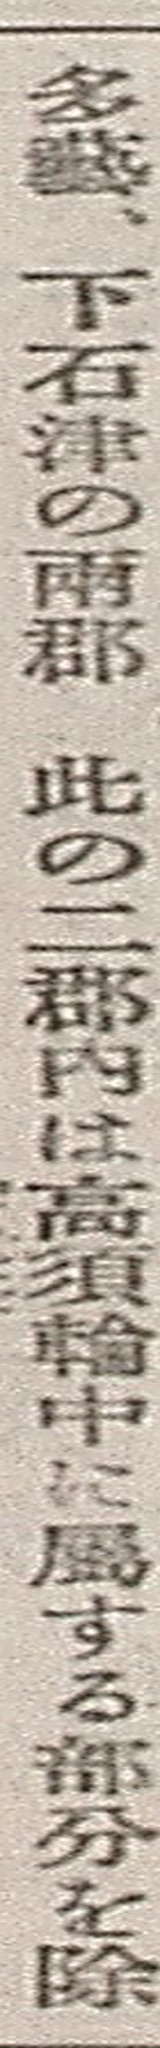多芸下石津の両郡此二郡内は高須輪中に属する部分を除
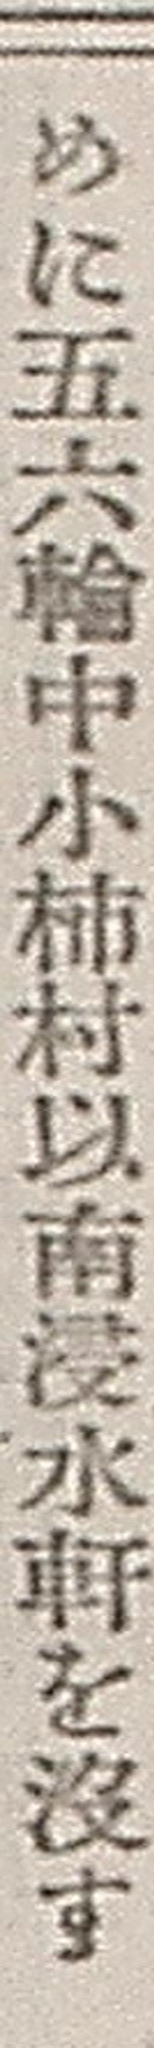めに五六輪中小柿村以南浸水軒を没す
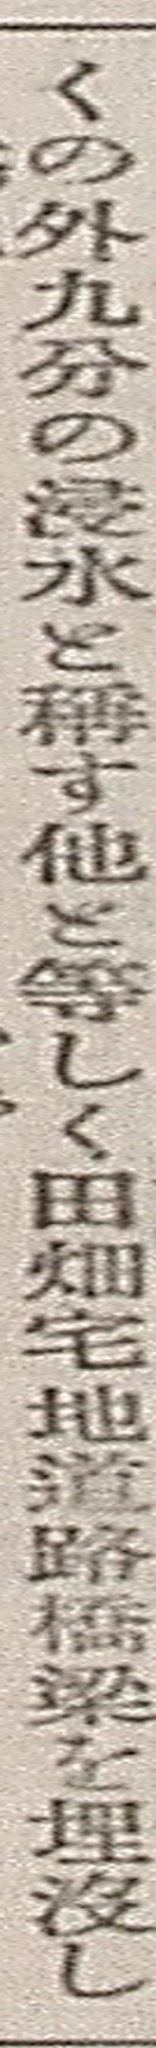くの外九分の浸水と称す他と等しく田畑宅地道路橋梁を埋没し
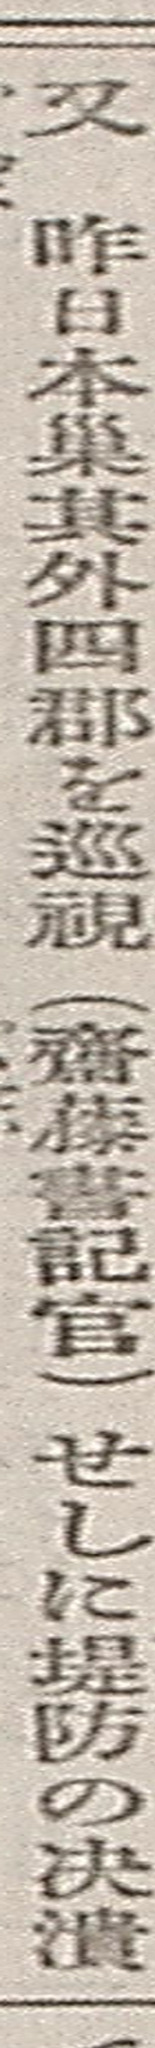又昨日本巣其外四郡を巡視せしに堤防の决潰
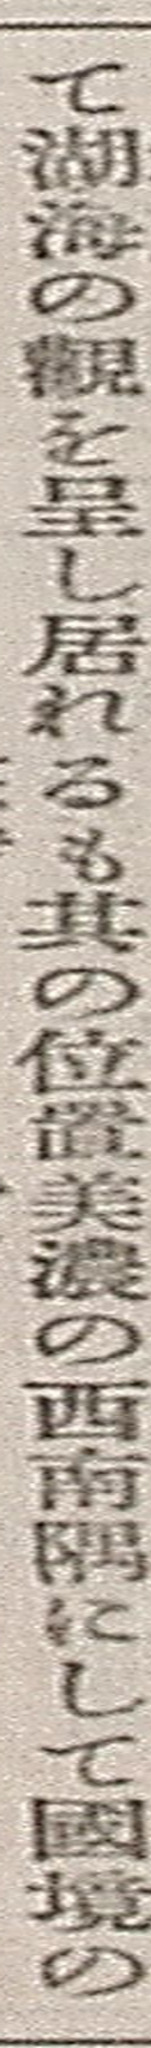て湖海の観を呈し居れるも其の位置美濃の西南隅にして国境の
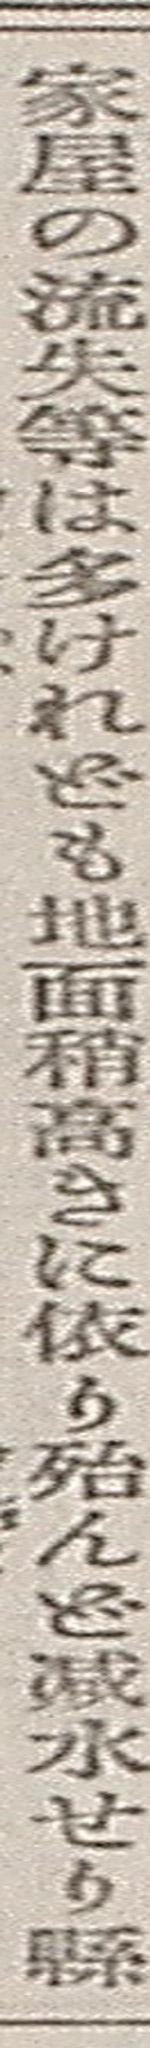家屋の流失等は多けれども地面稍高きに依り殆ど減水せり縣
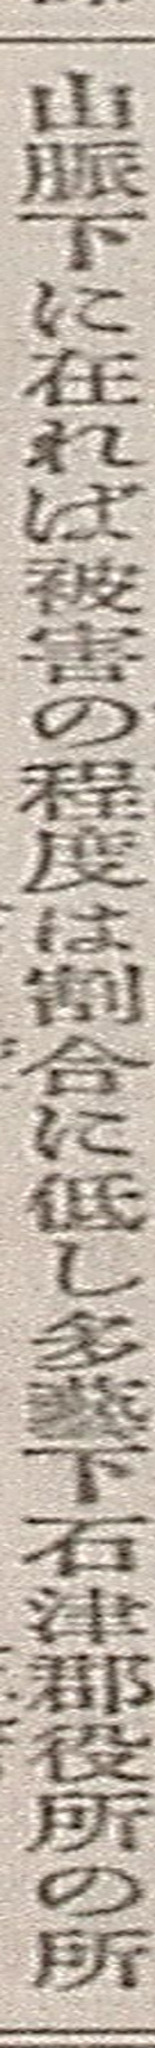山脈下に在れば被害の程度は割合に低し多芸下石津郡役所の所
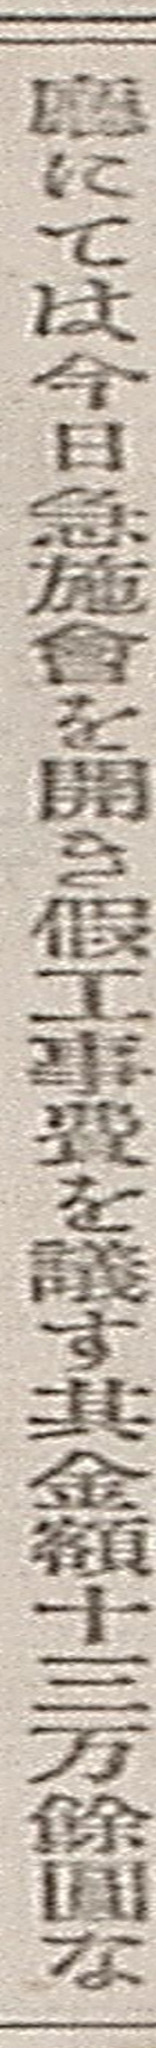廰にては今日急施会を開き仮工事費を議す其金額十三万餘円な
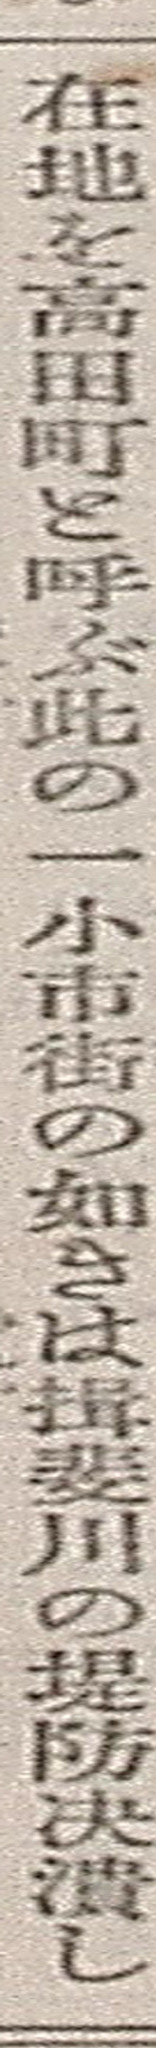在地を高田町と呼ぶ此の一小市街の如きは揖斐の堤防决潰れし
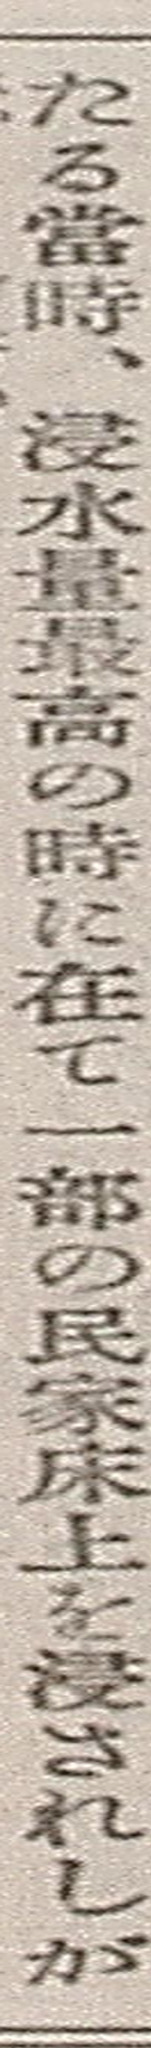たる当時、信水量最高の時に在て一部の民家床上を浸されしが
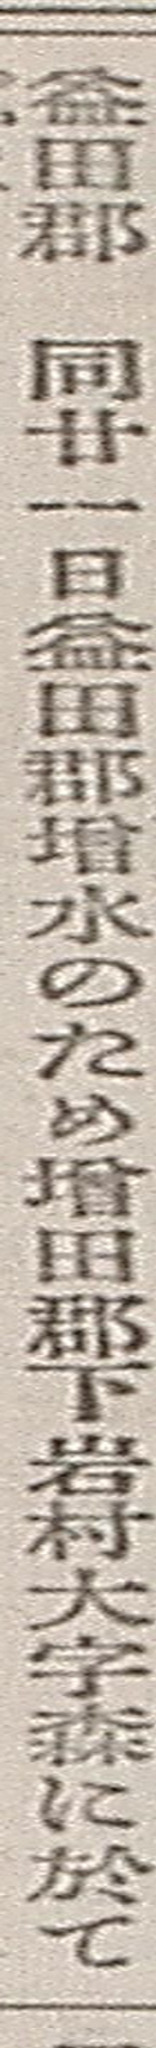益田郡同廿一日益田郡増水のため益田郡下岩村大字森に於て
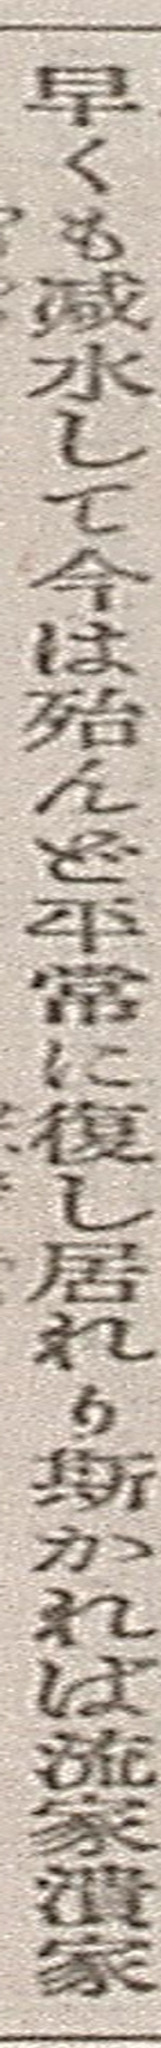早くも減水して今は殆んど平常に復し居れり斯かれば流家潰家
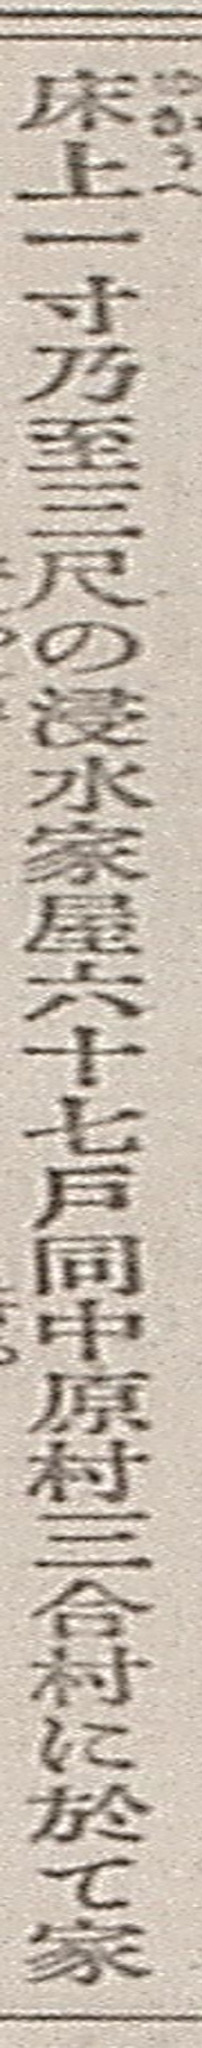床上一寸乃至三尺の浸水家屋六十七戸同中原村三合村に於て家
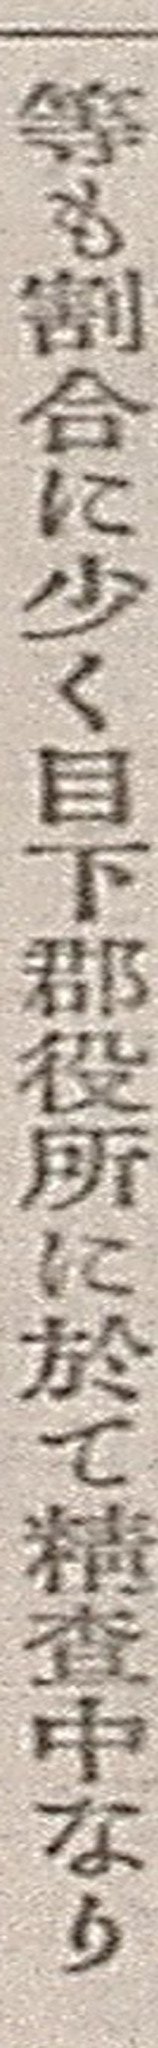等も割合に少く目下郡役所に於て精査中なり
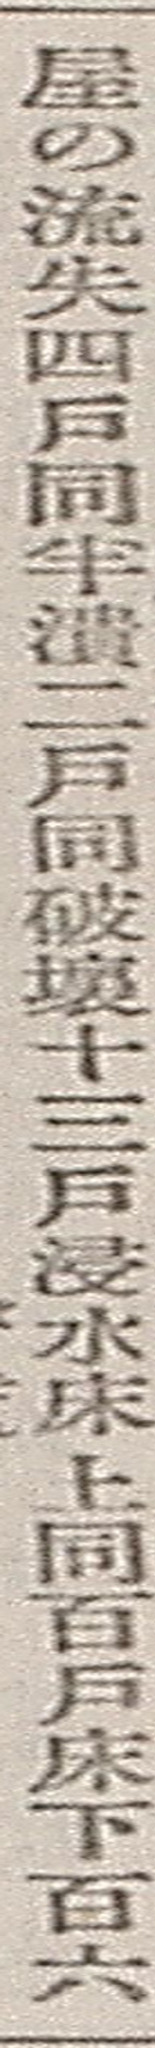屋の流失四戸同半潰二戸同破壊十三戸浸水床上同百戸床下百六
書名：風俗畫報臨時増刊第百二十六號　洪水被害録（中）
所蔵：東京大学地震研究所図書室 Earthquake Research Institute Library, The University of Tokyo, JAPAN
